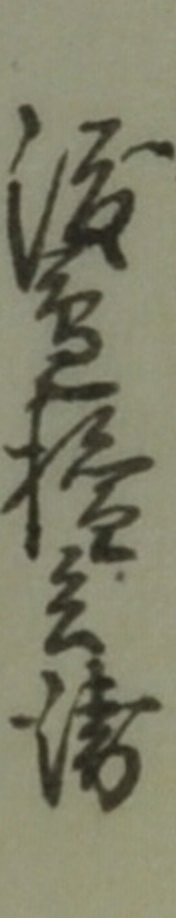渡辺権兵衛
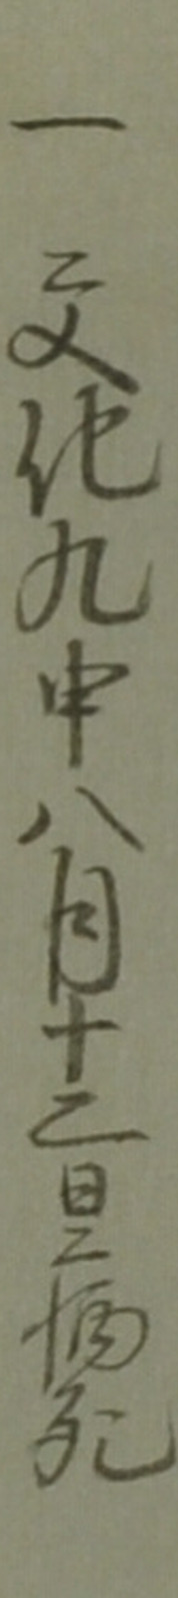一文化九月申八月十二日病死
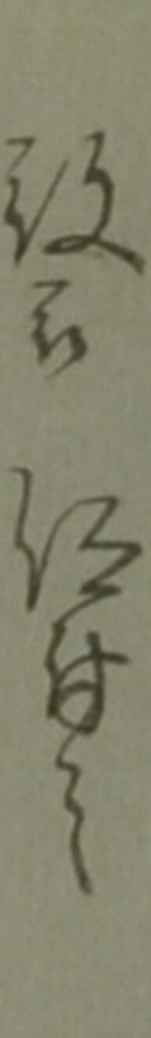役被仰付之
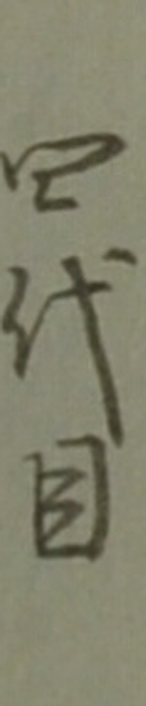四代目
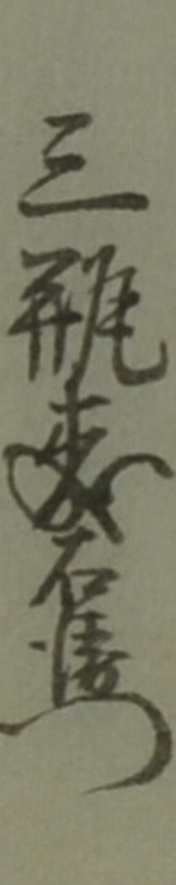三瓶森右衛門
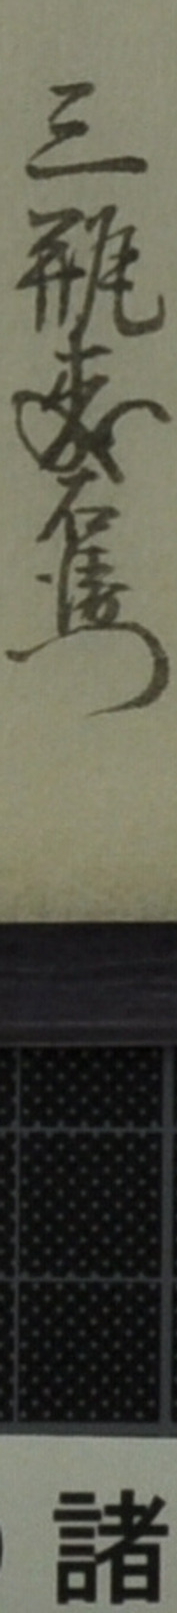三瓶森右衛門
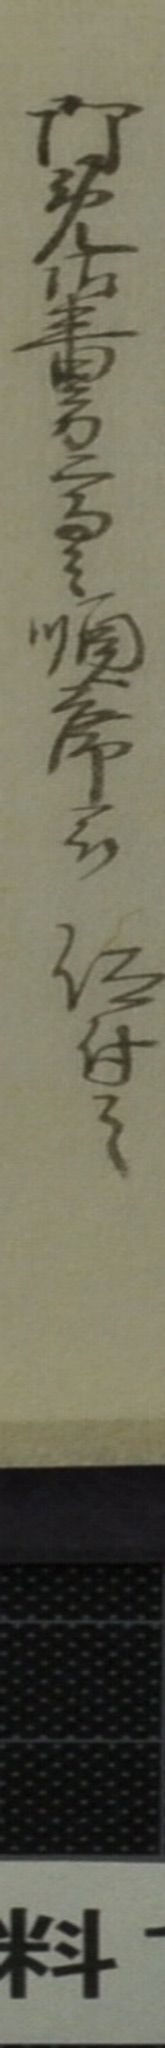御免御番方高之順席被仰付之
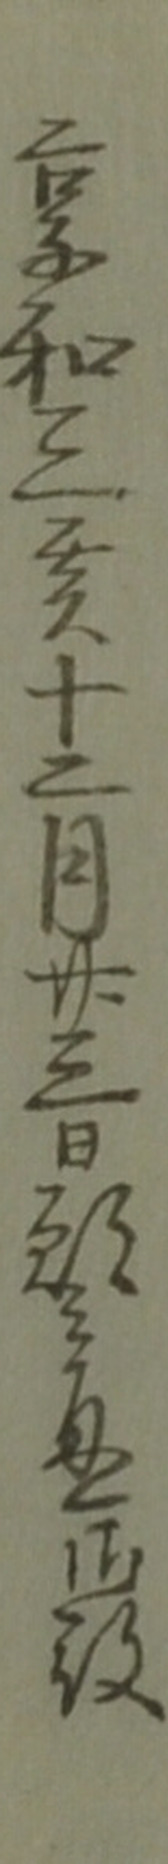一享和三亥十二月廿三日願之通御役
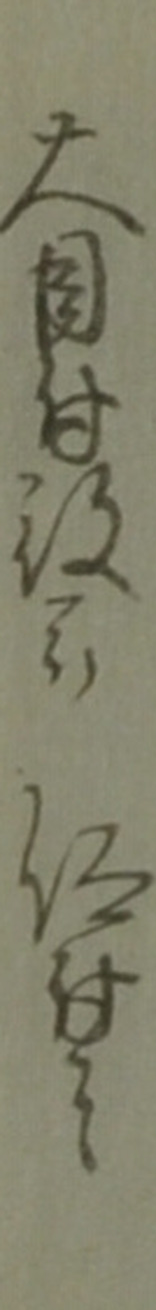大目付役被仰付之
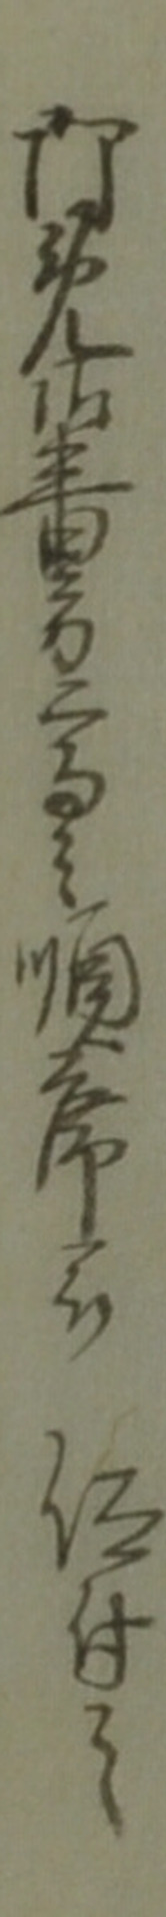御免御番方高之順席被仰付之
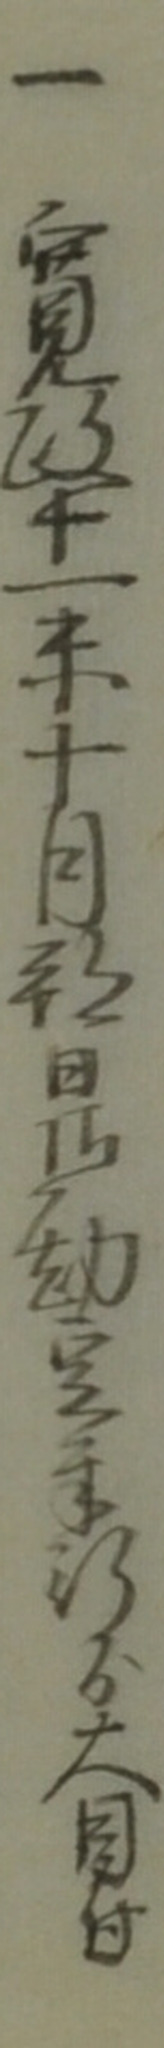一寛政十一未十月朔日御勘定奉行ゟ大目付
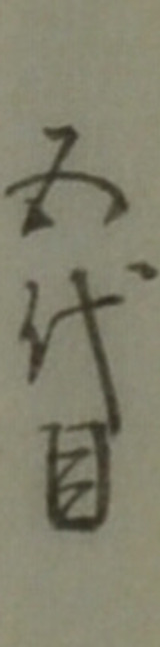五代目
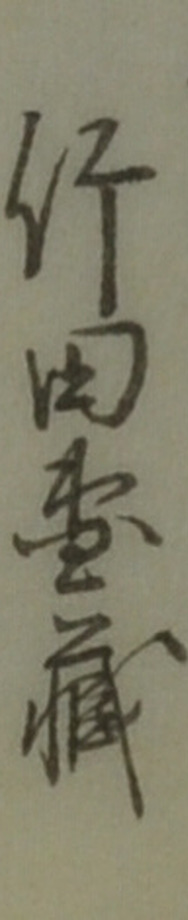竹田團蔵
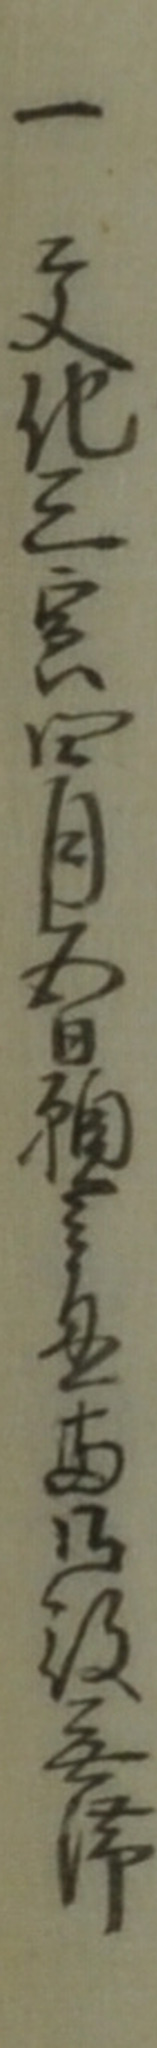一文化三寅四月五日願之通両御役無滞
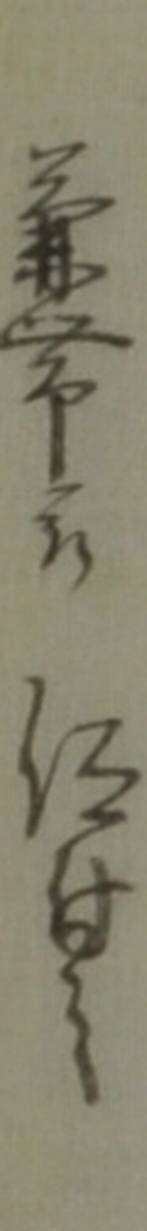兼帯被仰付之
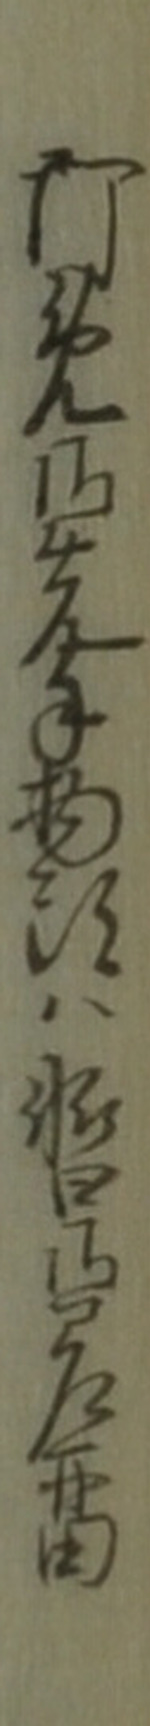御免御先手物頭ハ暫御差留
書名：諸御役代々録（三）
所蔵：伊那市立高遠町図書館・合同会社AMANE
